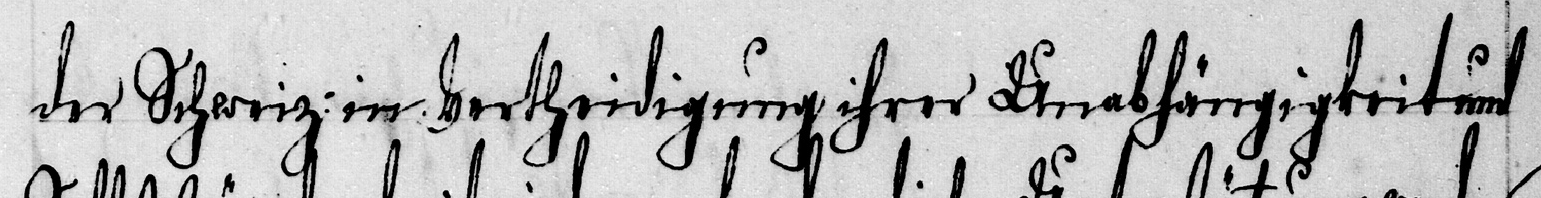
der Schweiz in Vertheidigung ihrer Unabhängigkeit und
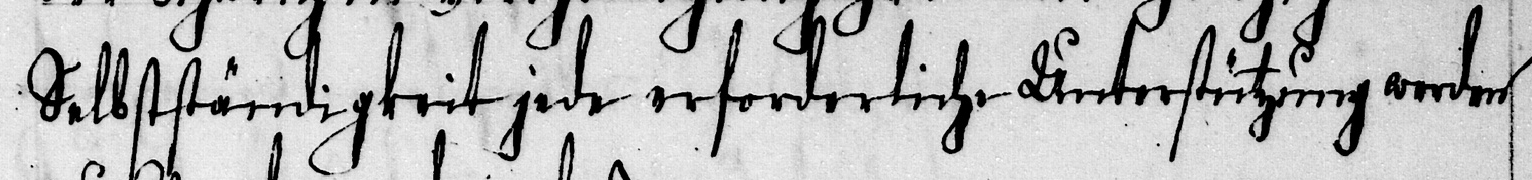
Selbstständigkeit jede erforderliche Unterstützung werden
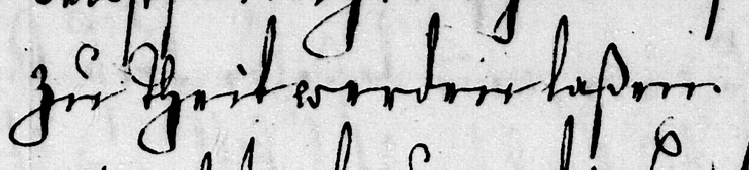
zu Theil werden laßen.
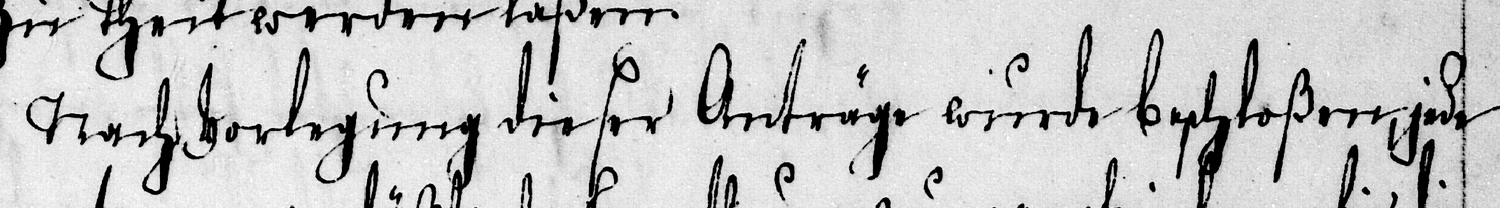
Nach Vorlegung dieser Anträge wurde beschloßen, jede
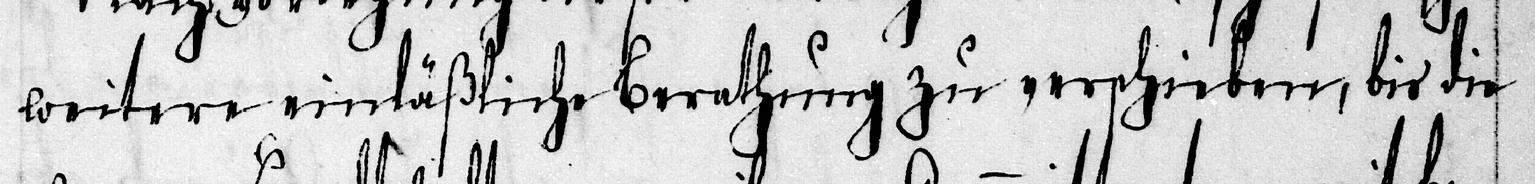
weitere einläßliche Berathung zu verschieben, bis die
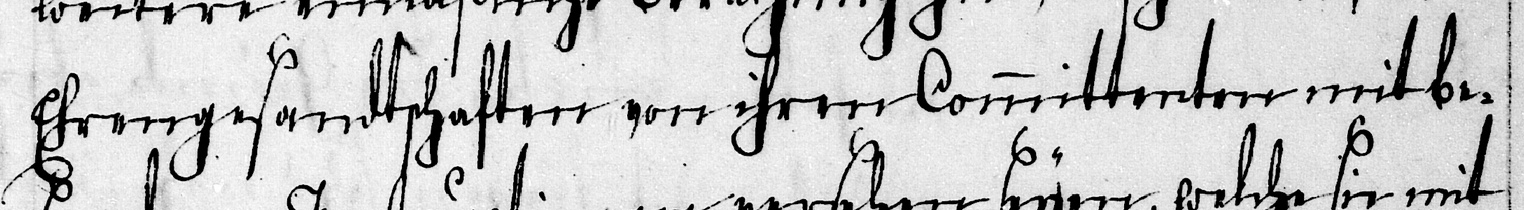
Ehrengesandtschaften von ihren Committenten mit be¬
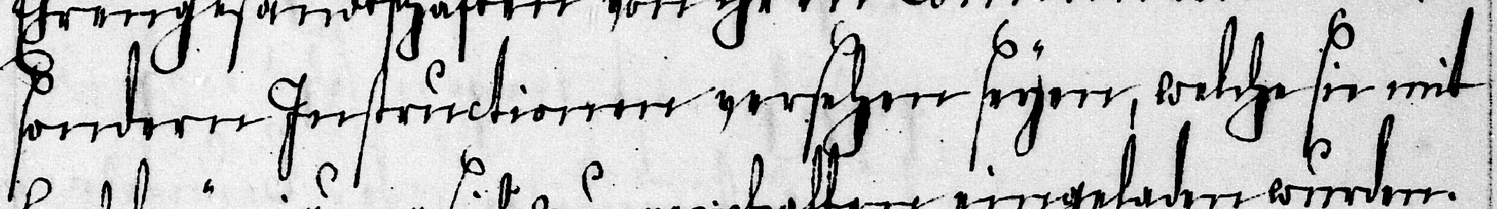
sondern Instructionen versehen seyen, welche sie mit
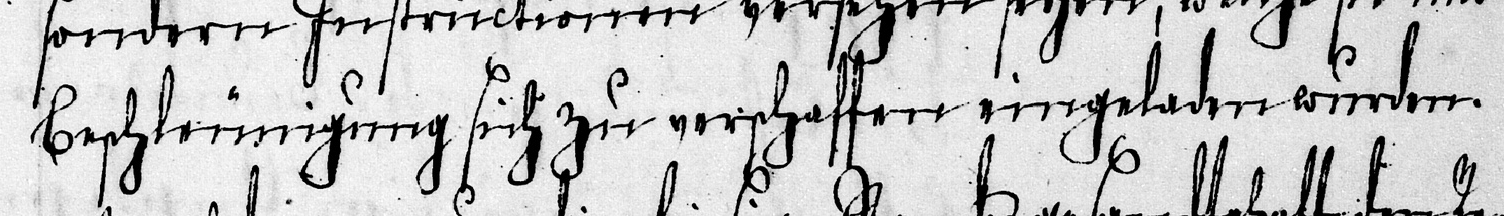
Beschleunigung sich zu verschaffen eingeladen wurden.
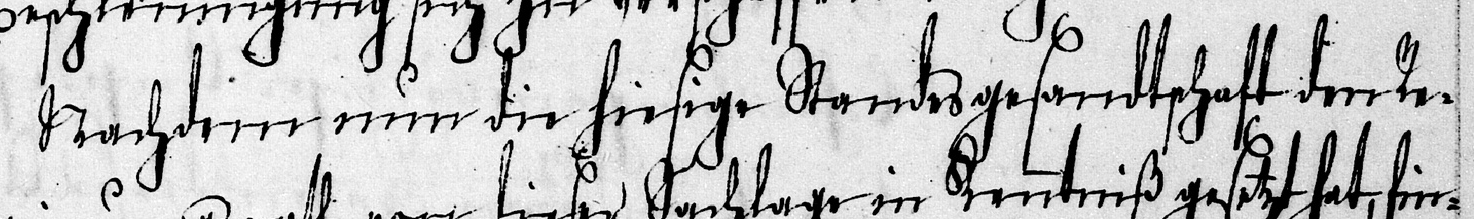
Nachdem nun die hiesige Standesgesandtschaft den Re¬
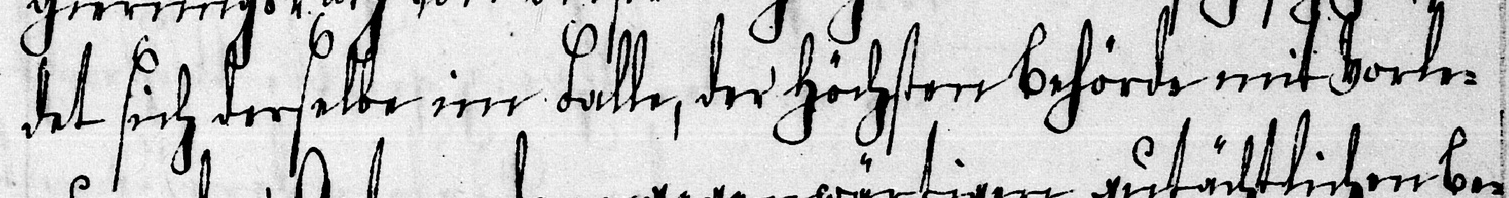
det sich derselbe im Falle, der Höchsten Behörde mit Vorle¬
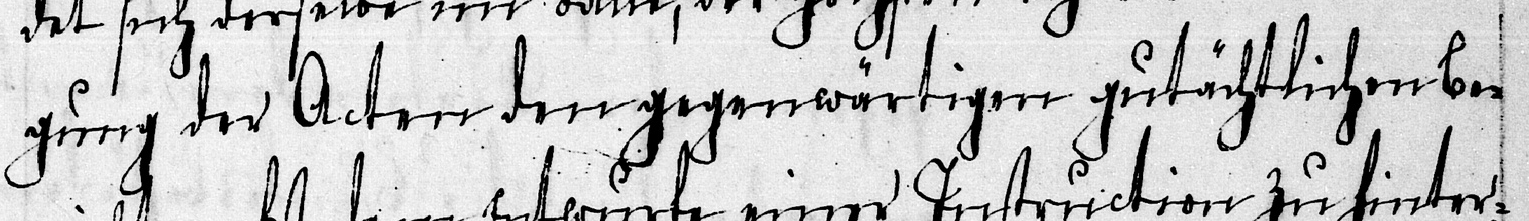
gung der Acten den gegenwärtigen gutächtlichen Be¬
